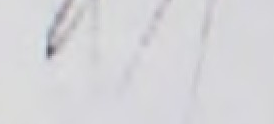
11
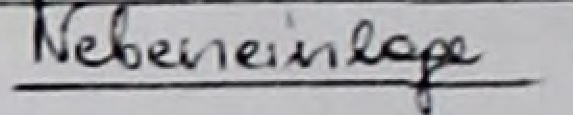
Nebeneinlage
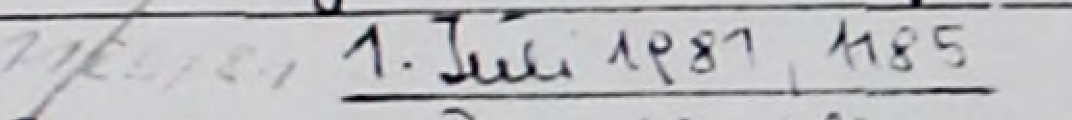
1185/81, 1. Juli 1981, 1185
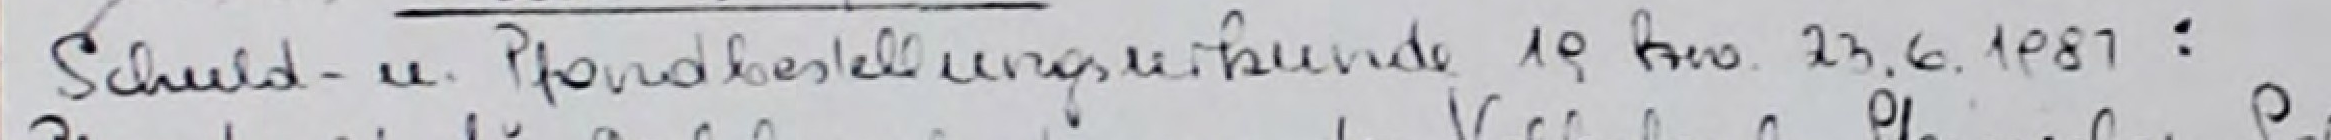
Schuld- u. Pfandbestellungsurkunde 19. bzw. 23.6.1981:
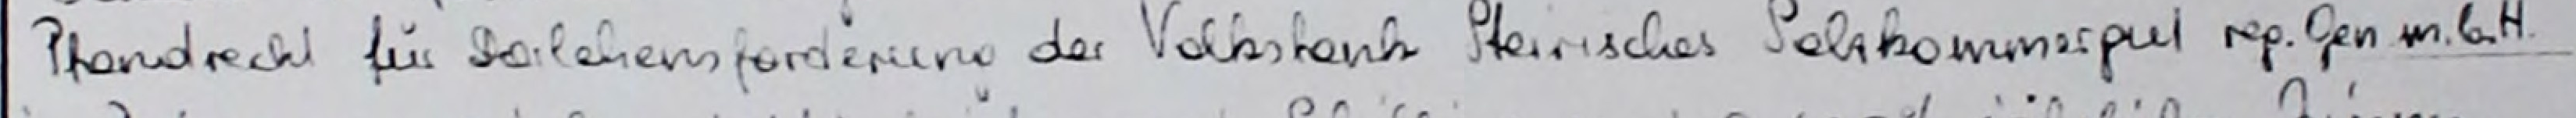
Pfandrech für Darlehensforderung der Volksbank Steirisches Salzkammergut reg. Gen. m. C. H.
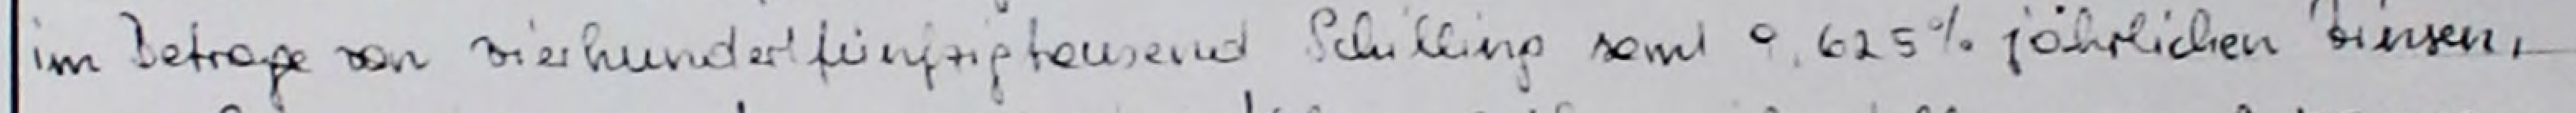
im Betrage von vier hundert fünfzig tausend Schillings samt 9,625 % jährlichen Zinsen,
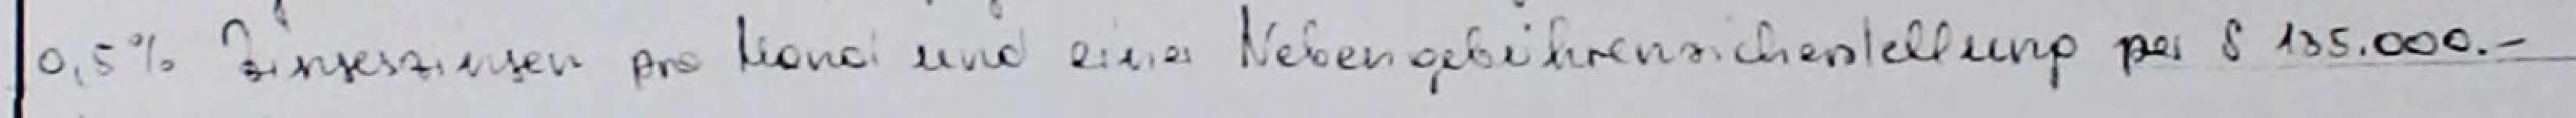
0,5% Zinseszinsen per Mond und einer Nebengebührensicherstellung per S 135.000.-
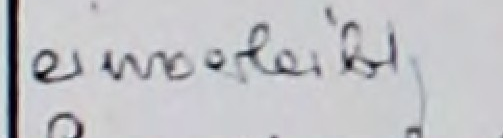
einverleibt,
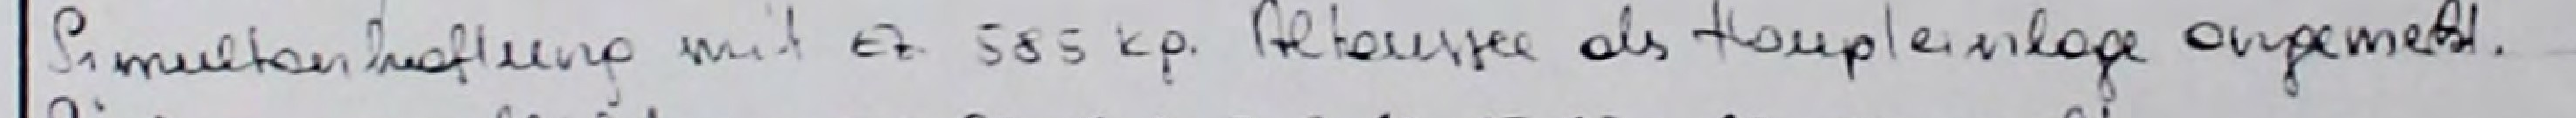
Simultanhaftung mit EZ 585 kp. Altaussee als Haupteinlage angemerkt.
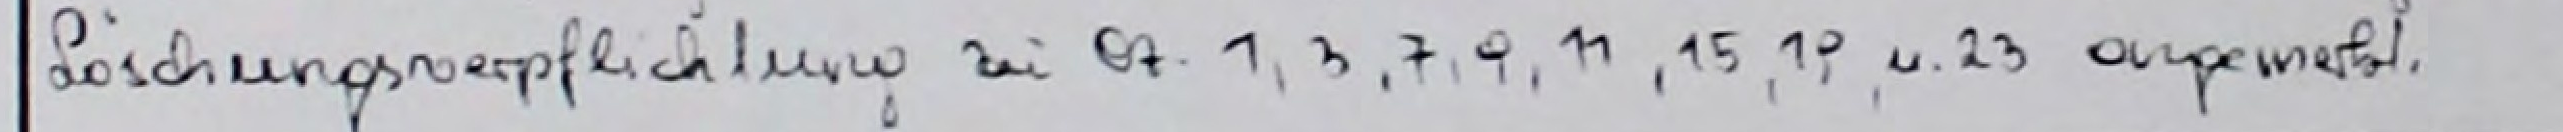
Löschungsverpflichtung zu OZ. 1, 3, 7, 9, 11, 15, 19, u. 23 angemerkt.
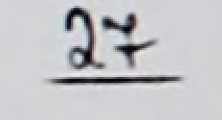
27
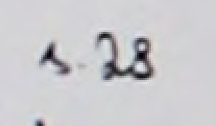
s. 28
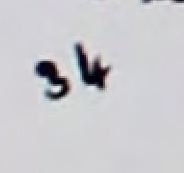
34
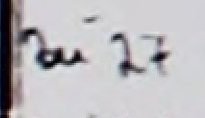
zu 27
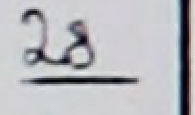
28
